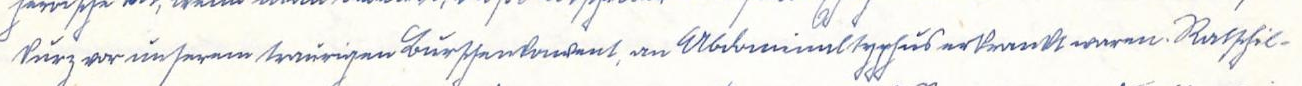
kurz vor unserem traurigen Burschenkonvent, an Abdominaltyphus erkrankt waren. Ratschil-
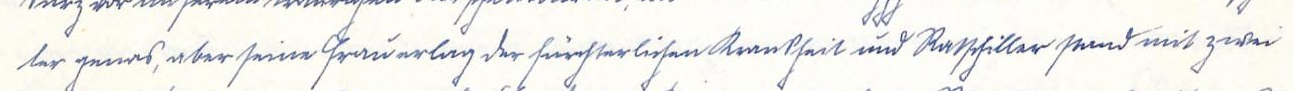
ler genas, seine Frau erlag der fürchterlichen Krankheit und Ratschiller stand mit zwei
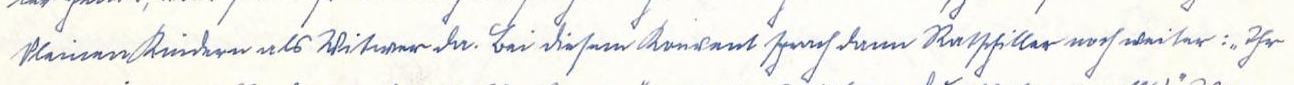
kleinen Kindern als Witwer dar. Bei diesem Konvent sprach dann Ratschiller noch weiter: „Ihr
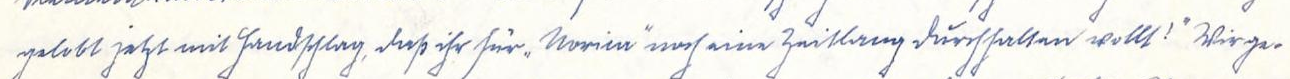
gelobt jetzt mit Handschlag, dass ihr für „Norica“ noch eine Zeit lang durchhalten wollt!“ Wir ge-
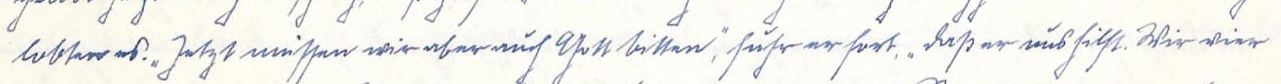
lobten es. „Jetzt müssen wir aber auch Gott bitten“, fuhr er fort, „dass er uns hilft. Wir vier
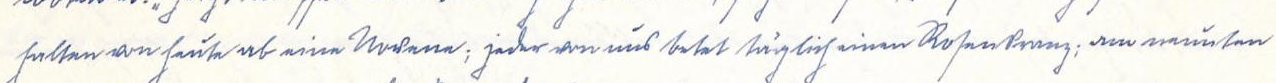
halten von heute ab eine Novene; jeder von uns betet täglich einen Rosenkranz; am neunten
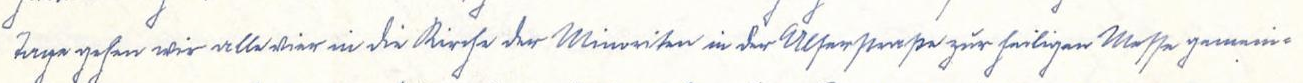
Tage gehen wir alle vier in die Kirche der Minoriten in der Alserstraße zu heiligen Messe gemein-
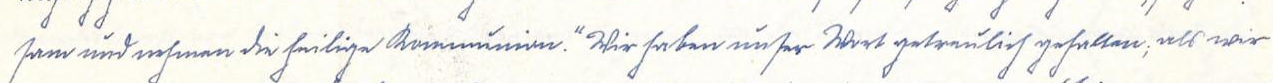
sam und nehmen die heilige Kommunion.“ Wir haben unser Wort getreulich gehalten; als wir
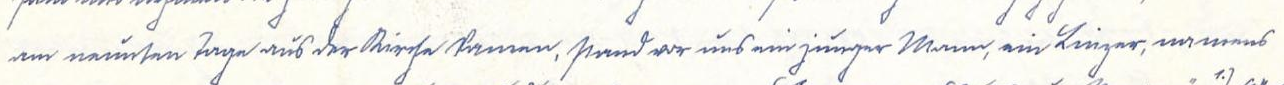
am neunten Tage aus der Kirche kamen, stand vor uns ein junger Mann, ein Linzer namens
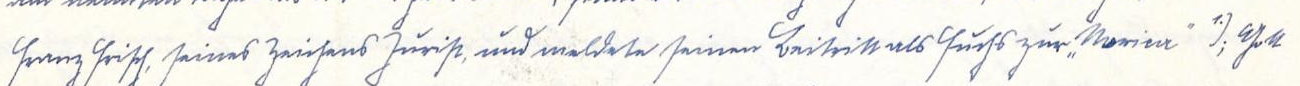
Franz Frisch, seines Zeichens Jurist, und meldete seinen Beitritt als Fuchs zur „Norica“ 1) Gott
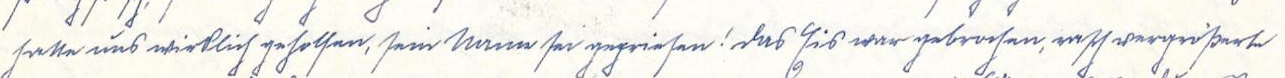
hatte uns wirklich geholfen, sein Name sei gepriesen! Das Eis war gebrochen, rasch vergrößerte
